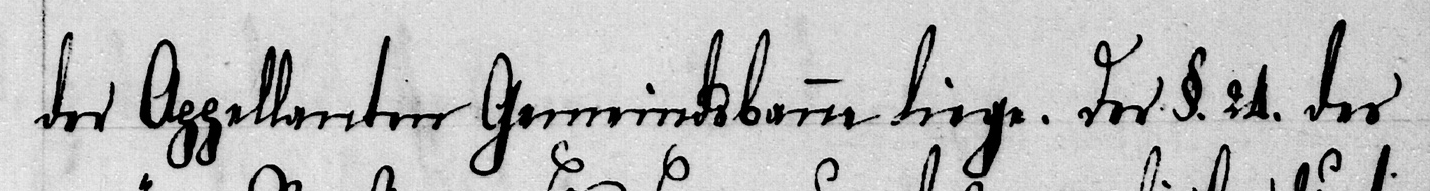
der Appellanten Gemeindsbanne liege. Der §. 24. des
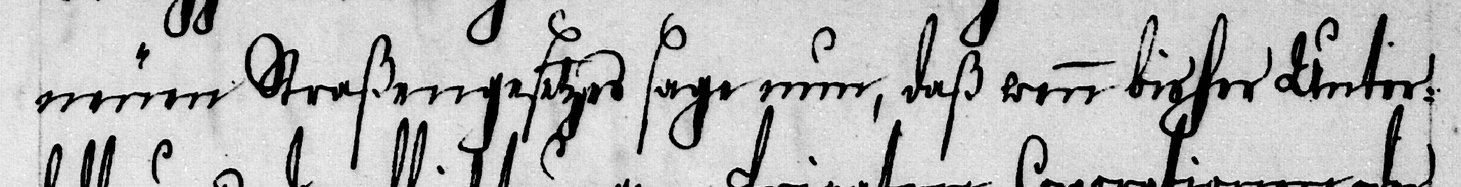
neuen Straßengesetzes sage nun, daß wenn bisher Unter¬
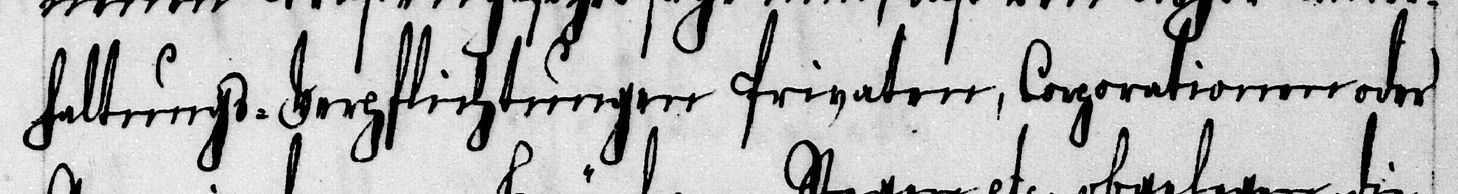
haltungs-Verpflichtungen Privaten, Corporationen oder
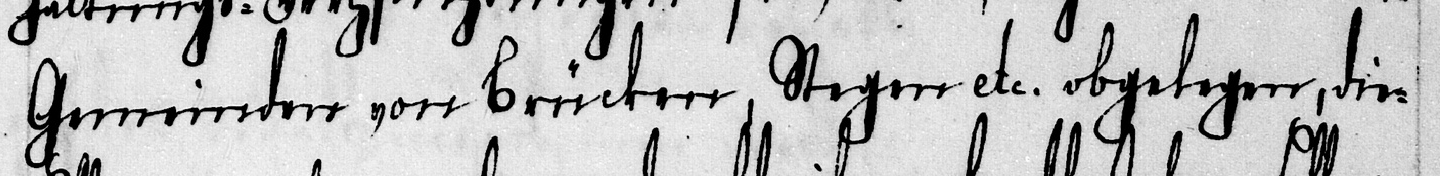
Gemeinden von Brücken, Stegen etc. obgelegen, die¬
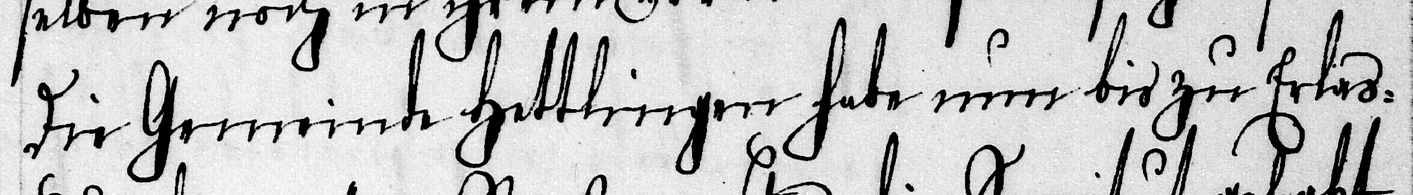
Die Gemeinde Hettlingen habe nun bis zu Erlaß¬
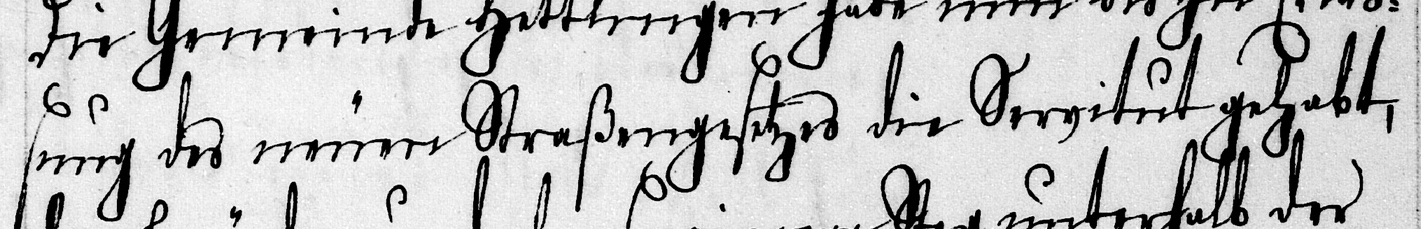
ung des neuen Straßengesetzes die Servitut gehabt,
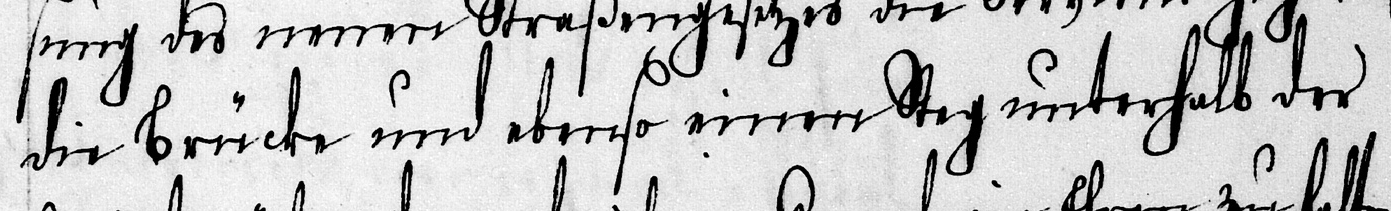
die Brücke und ebenso einen Steg unterhalb der
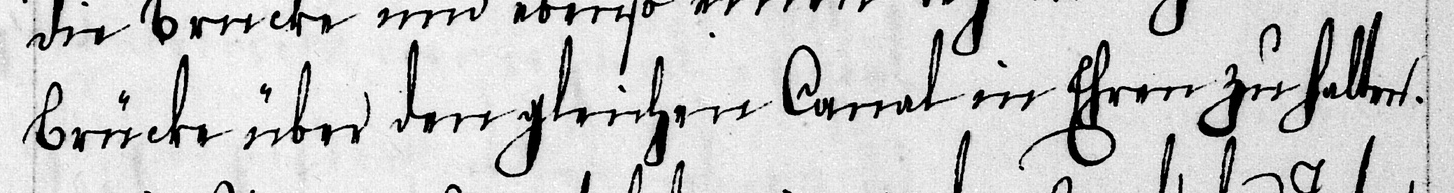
Brücke über den gleichen Canal in Ehren zu halten.
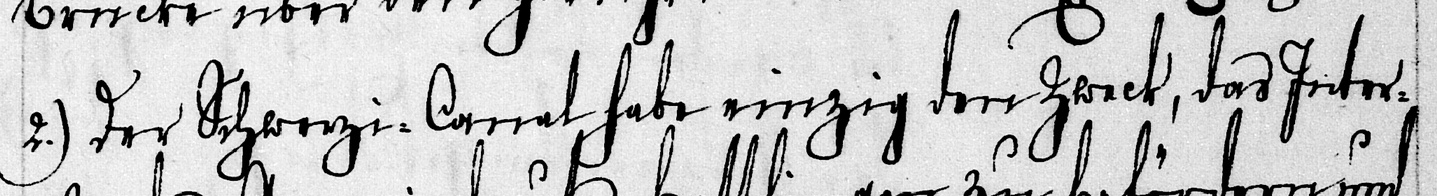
2.) Der Schwerzi-Canal habe einzig den Zweck, das Inter¬
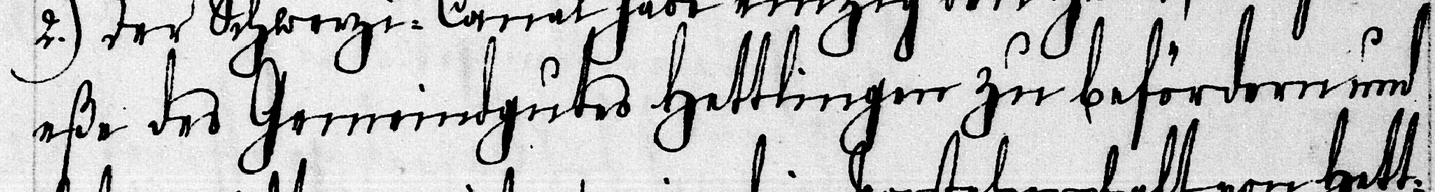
eße des Gemeindgutes Hettlingen zu befördern und
